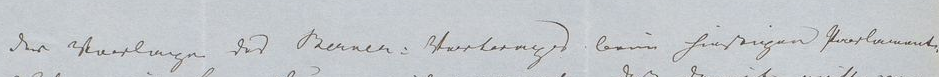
der Vorlage des Berner -Vertrags beim hießigen Parlament.
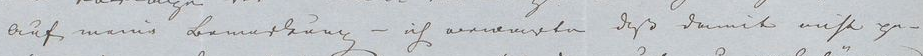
Auf meine Bemerkung – ich erwarte daß damit nicht ge-
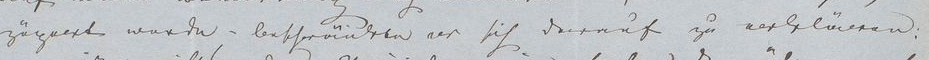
zögert werde – beschränkte er sich darauf zu erklären:
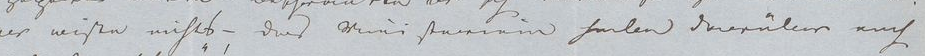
«er wiße nichts – das Ministerium habe darüber noch
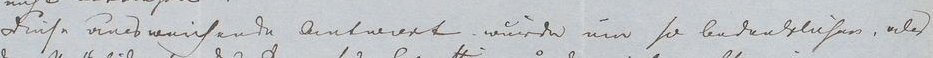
Diese ausweichende Antwort wurde um so bedenklicher, als
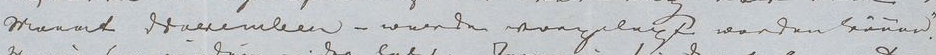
Monat November – werde vorgelegt werden können.»
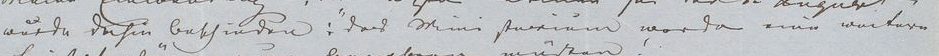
wurde dahin beschieden: «das Ministerium werde eine weitere
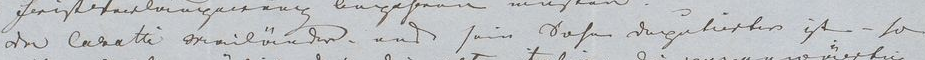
Da CasattiMailänder – und sein Sohn Deputirter ist – so
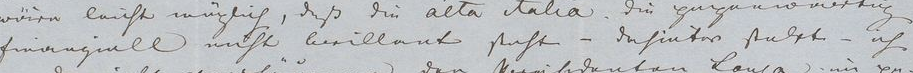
finanziell nicht brillant steht – dahinter stekt – ich
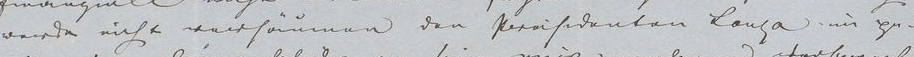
werde nicht versäumen den Präsidenten Lanza im ge-
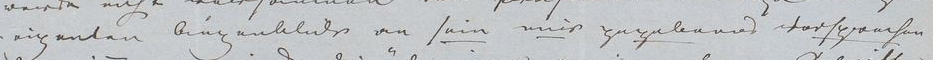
eigneten Augenblik an seinmirgegebenesVersprechen
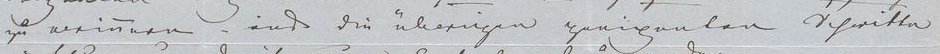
zu erinnern – und die übrigen geeigneten Schritte
